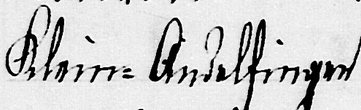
Klein-Andelfingen
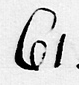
61.
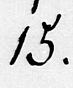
15.
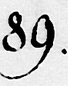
89.
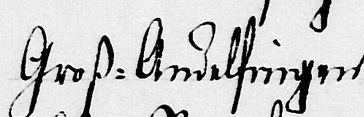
Groß-Andelfingen
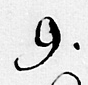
9.
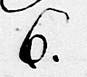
6.
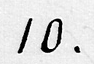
10.
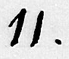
11.
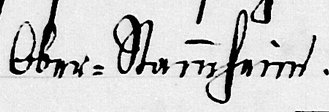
Ober-Stammheim
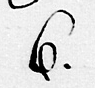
6.
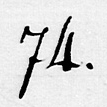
74.
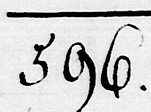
596.
